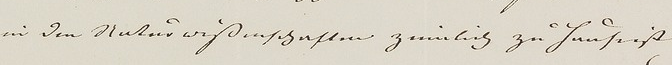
in den Naturwißenschaften ziemlich zu Hause ist.
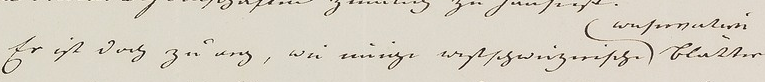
Es ist doch zu arg, wie einige westschweizerischeconservative
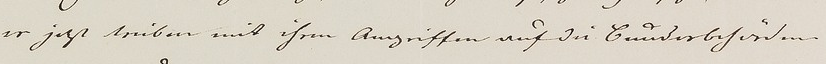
es jetzt treiben mit ihren Angriffen auf die Bundesbehörden.
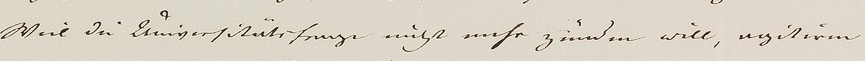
Weil die Universitätsfrage nicht mehr zünden will, agitiren
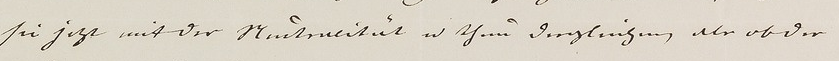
sie jetzt mit der Neutralität u thun dergleichen, als ob der
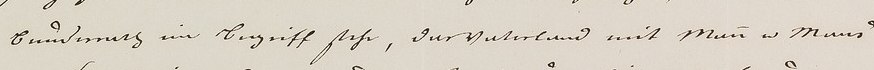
Bundesrath im Begriff stehe, das Vaterland mit Mann u Maus
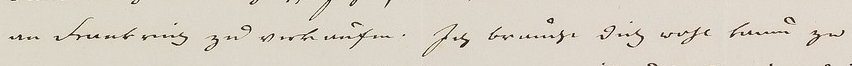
an Frankreich zu verkaufen. Ich brauche Dich wohl kaum zu
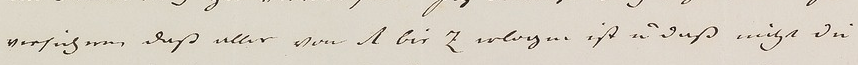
versichern, daß alles von A bis Z erlogen ist u daß nicht die
